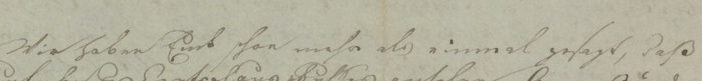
Wir haben Euch schon mehr als einmal gesagt, daß
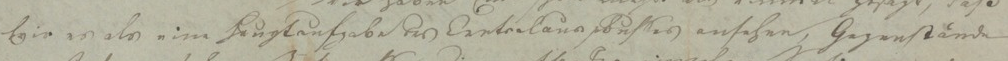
wir es als eine Hauptaufgabe des Centralausschusses ansehen, Gegenstände
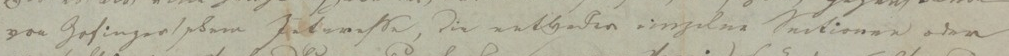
von Zofinger'schem Interesse, die entweder einzelne Sectionen oder
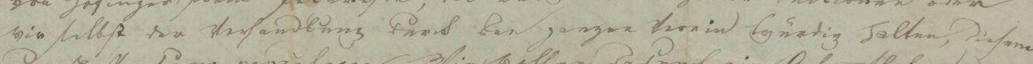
wir selbst der Verhandlung durch den ganzen Verein würdig halten, diesem
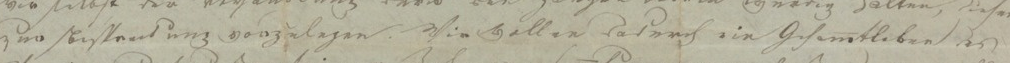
zur Besprechung vorzulegen. Wir wollen dadurch ein Gesammtleben des
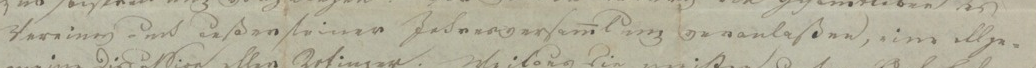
Vereines auch außer seiner Jahresversammlung veranlaßen, eine allge-
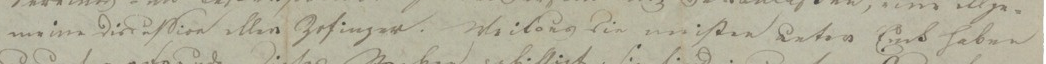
meine Discussion aller Zofinger. Weitaus die meisten unter Euch haben
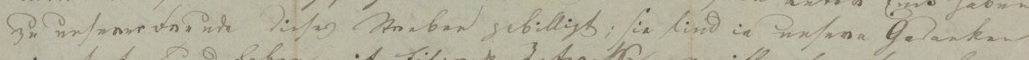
zu unserer Freude dieses Streben gebilligt; sie sind in unsere Gedanken
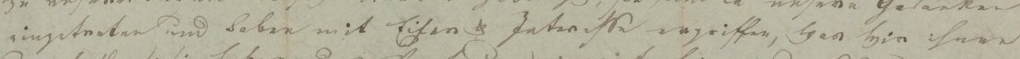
eingetreten und haben mit Eifer & Interesse ergriffen, was wir ihnen
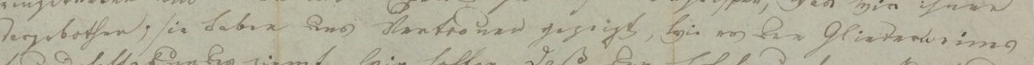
dargebothen; sie haben uns Vertrauen gezeigt, wie es den Gliedern eines
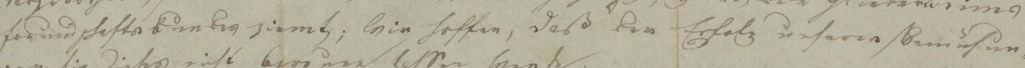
Freundschaftsbundes ziemt; wir hoffen, daß der Erfolg unserer Bemühun-
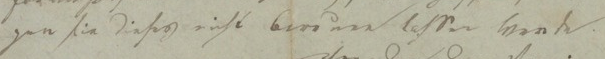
gen sie dieses nicht bereuen lassen werde.
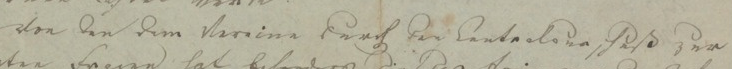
Von den dem Vereine durch den Centralausschuß zur
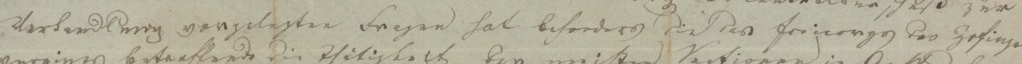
Verhandlung vorgelegten Fragen hat besonders die das Freicorps des Zofinger-
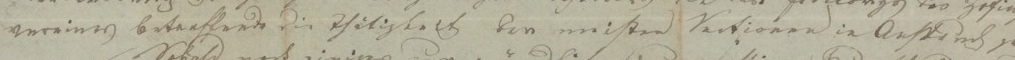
vereines betreffende die Thätigkeit der meisten Sectionen in Anspruch ge-
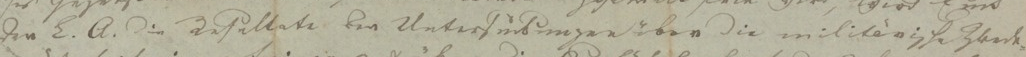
der C.A. die Resultate der Untersuchungen über die militärische Zweck-
